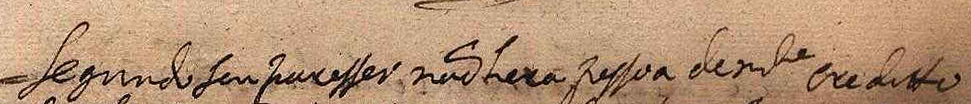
segundo seu paresser naõ hera pessoa de mto creditto
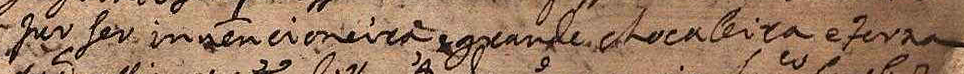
por ser inuēncioneira, e grande chocaleira e torna
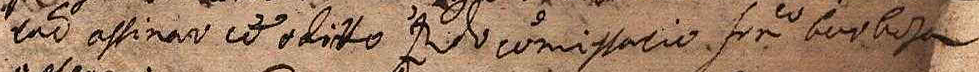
raõ assinar cō o ditto Rdo comissario frnco barboza
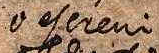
o escreui
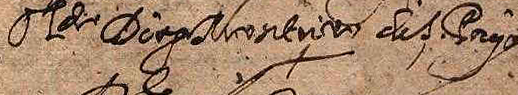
O Ldo Diogo Monteiro de S. Payo
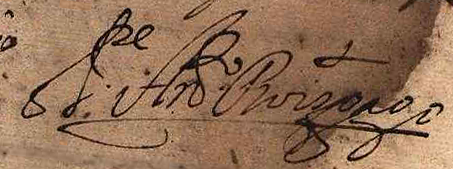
o P.e Anto Roiz gago
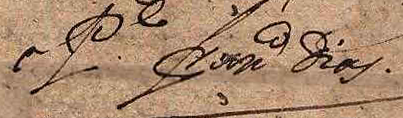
o P.e franco dias.
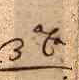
3a ta
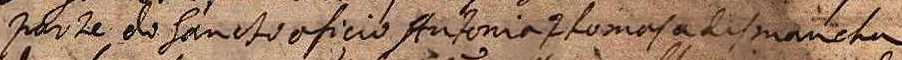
parte do Sancto oficio Antonia Thomas a desmancha
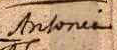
Antonia
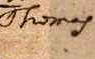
Thomas
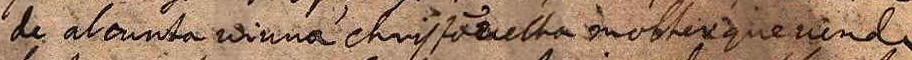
de alcunha uiuua christã uelha molher que uende
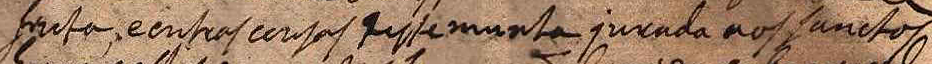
fruta, e outras cousas testemunha jurada aos sanctos
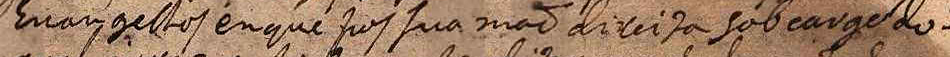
Euangelhos en que pos sua maõ direita sob cargo do
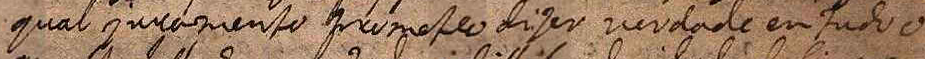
qual juramento prometeo dizer uerdade en tudo o
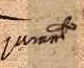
juramto
